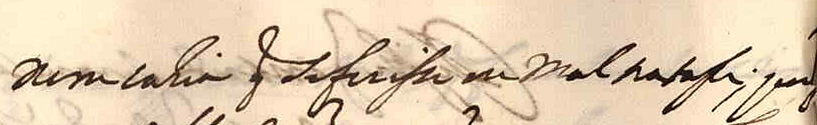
nem cahia q̄ se ferisse ou maltratasse, por
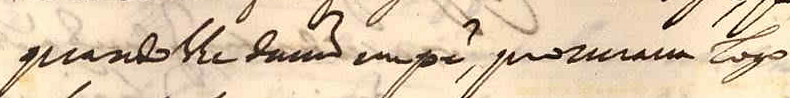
quando lhe dauaõ em pé, procuraua logo
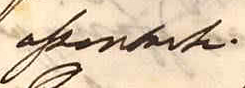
assentarse.
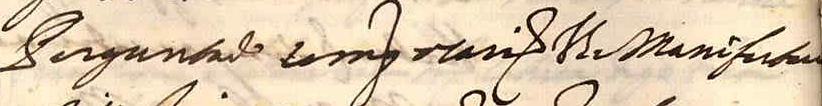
Perguntado com q̄ ocaziaõ lhe manifestou
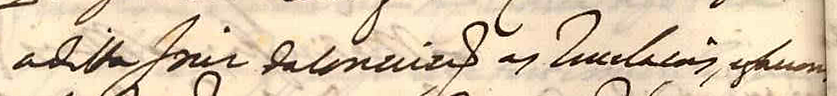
a ditta Jnes da conceiçaõ as Reuelaçois, e fauor
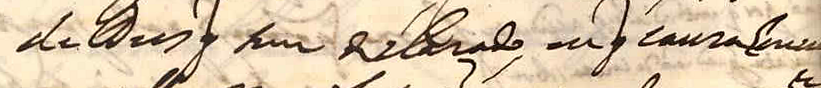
de Deos q̄ tem declarado, ou q̄ cauza houue
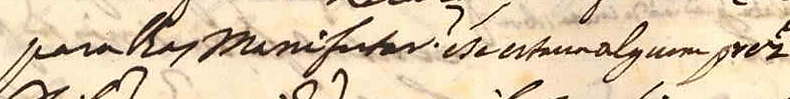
para lhas manifestar? e se estaua alguem prezte
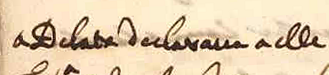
a Delata declaraua a elle
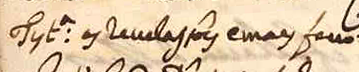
Testa: as Reuelassoẽs e mais fauo
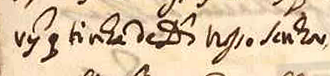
res q̄ tinha de Ds̄ nosso senhor
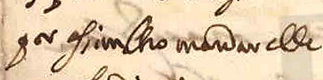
por assim lho mandar elle
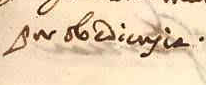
por obediensia.
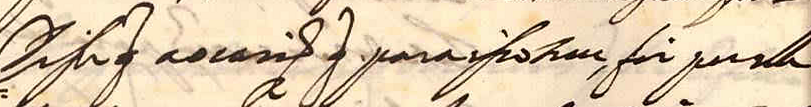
Disse q̄ a ocaziaõ q̄ para isso teue, foi por elle
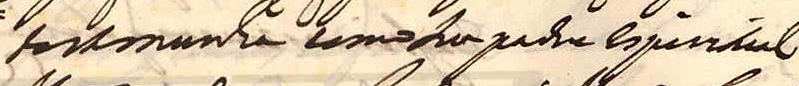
testemunha com o seu padre espiritual
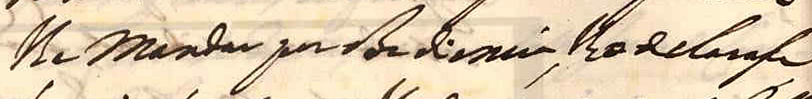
lhe mandar por obediencia, lhe declarasse
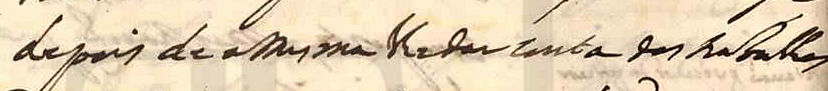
depois de a mesma lhe dar conta dos trabalhos
